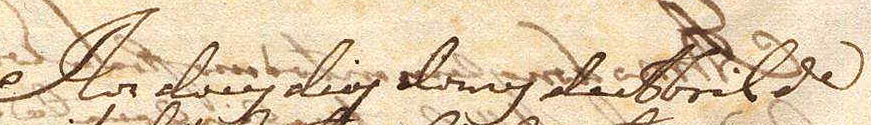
Aos dous dias do mes de Abril de
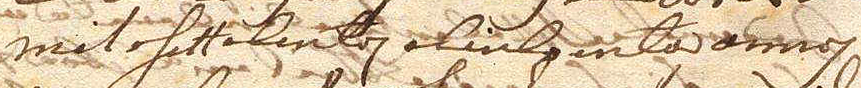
mil setteCentos e CinCoenta annos
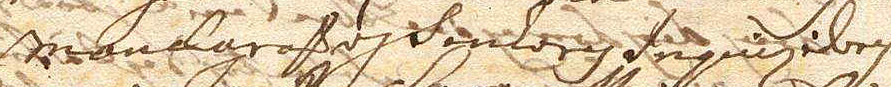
mandaraõ os Senhores Inquizidores
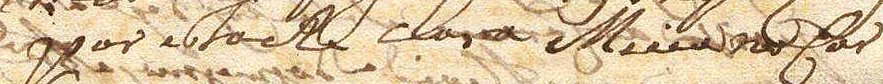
por esta Re clara Maria no Car
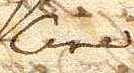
Cere
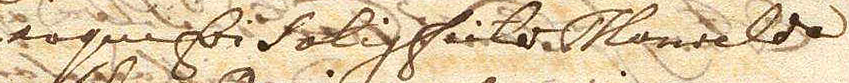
ao que foi satisfeito Manoel da
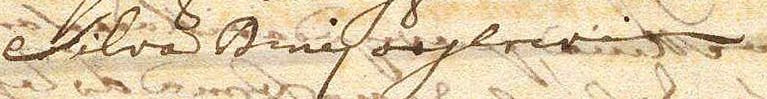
Silva Denis o escrevi
